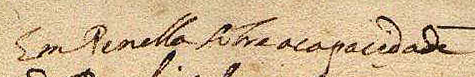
Em Penella sobre a capacidade
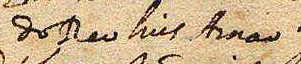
do Reo luis Arnao
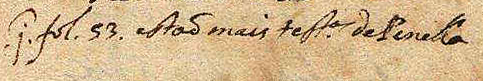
j̄. fol. 53. estaõ mais test.as de Penella
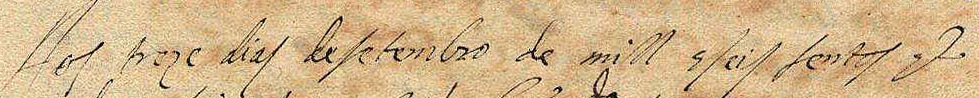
Aos treze dias de setembro de mill E seissentos &
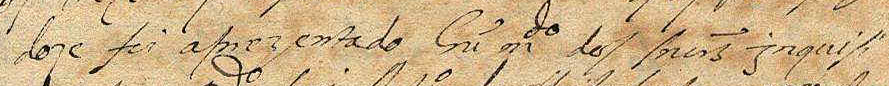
doze foi aprezentado hū mdo dos snors̄ jnquisi
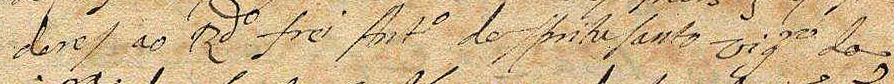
dores ao Rdo frei Anto do spritu santo vigro da
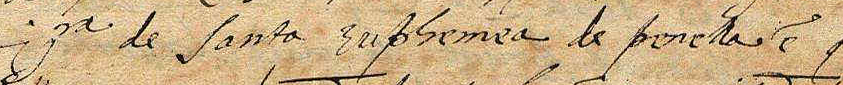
jgra de Santa Euphemea de penella ē q̄
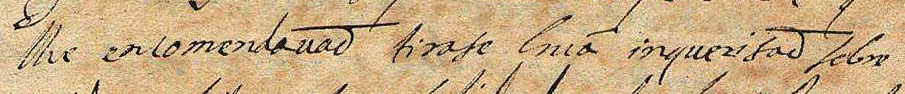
lhe encomendauão tirase huā inquerisão sobre
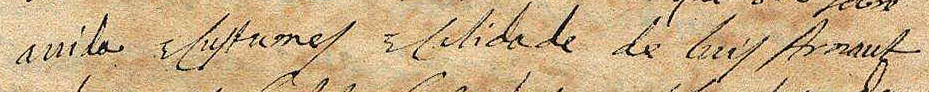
a uida E Custumes E Calidade de luis Arnaut
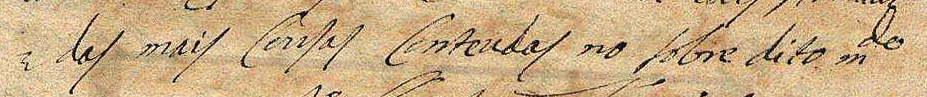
E das mais Cousas Conteudas no sobredito mdo
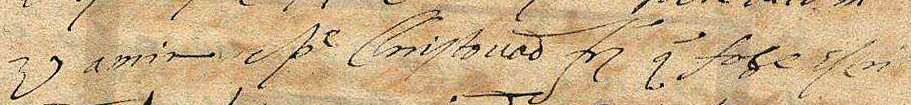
E a mim o pe Christouão frz̄ q̄ fose Escri
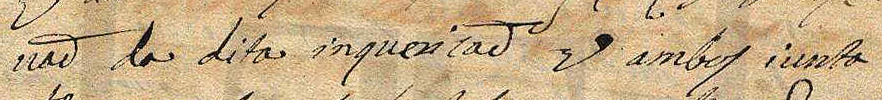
uaõ da dita inqueriçaõ E ambos iunta
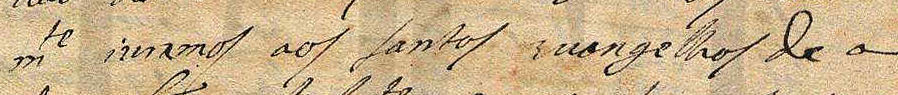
mte iuramos aos santos Euangelhos de a
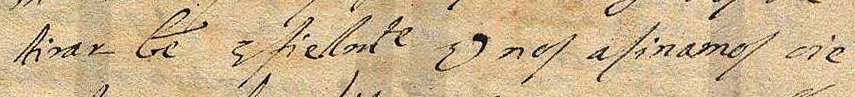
tirar bē E fielmte E nos asinamos oie
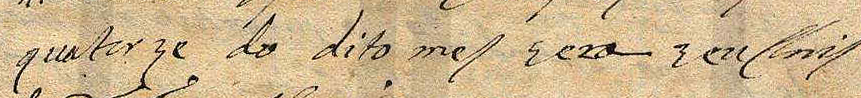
quatorze do dito mes E era E eu Chris
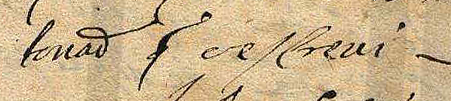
touaõ q̄ o esCreui -
